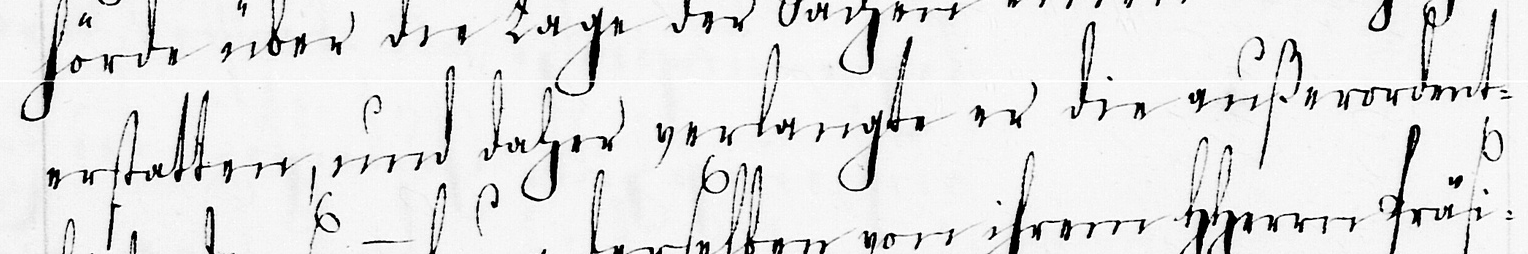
erstatten, und daher verlangte er die außerordent¬
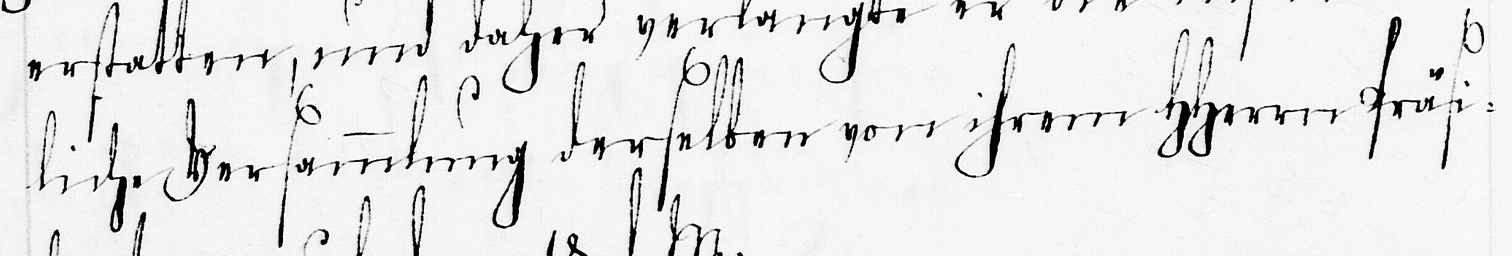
liche Versammlung derselben von ihrem HHerrn Präsi¬
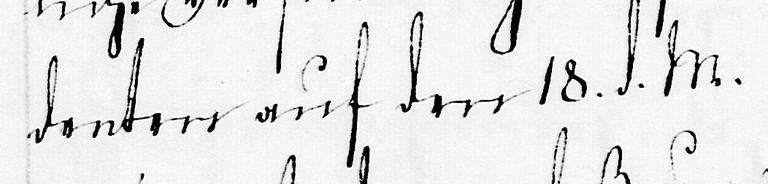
denten auf den 18. d. M.
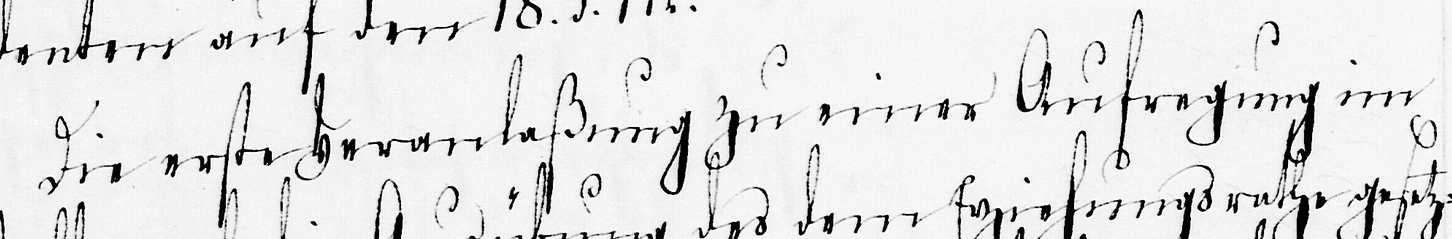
Die erste Veranlaßung zu einer Aufregung im
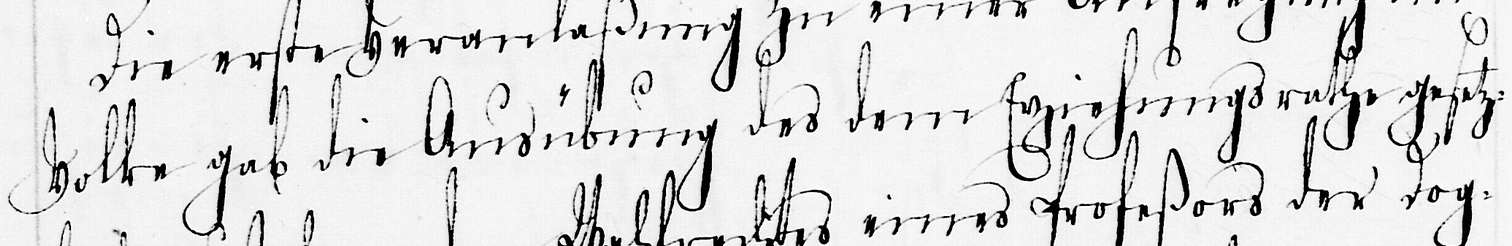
Volke gab die Ausübung des dem Erziehungsrathe geset¬
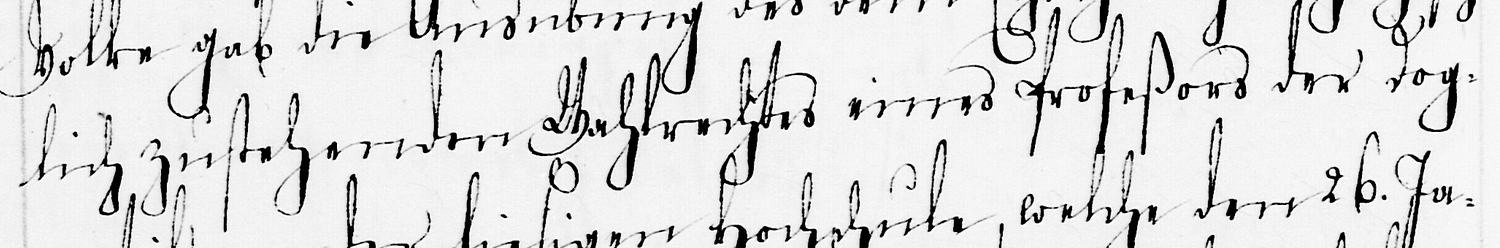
lich zustehenden Wahlrechtes eines Profeßors der Dog¬
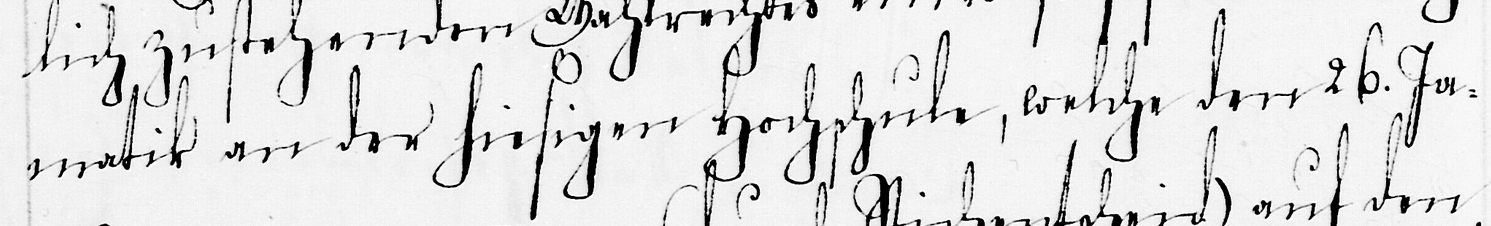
matik an der hiesigen Hochschule, welche den 26. Ja¬
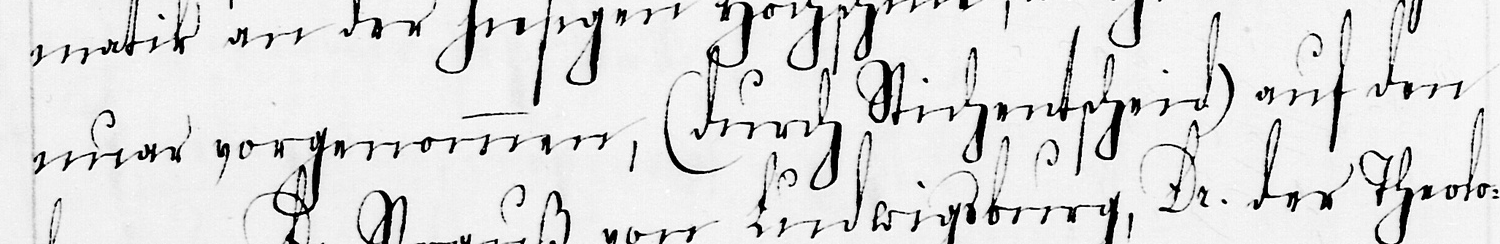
nuar vorgenommen, (durch Stichentscheid) auf den
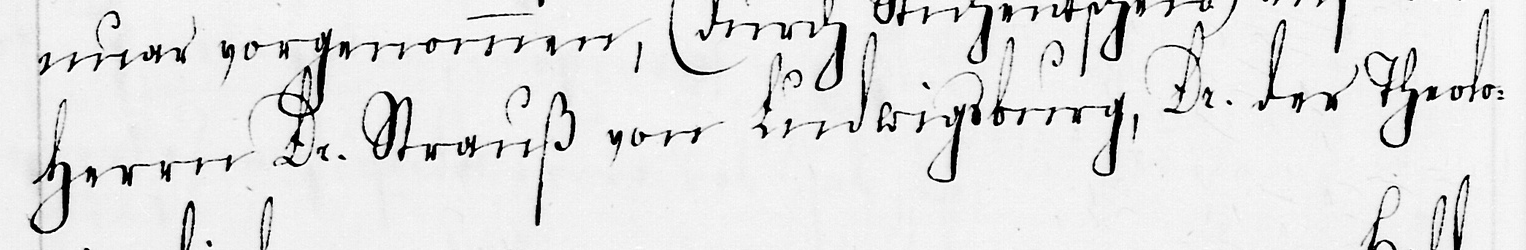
Herrn Dr. Strauß von Ludwigsburg, Dr. der Theolo¬
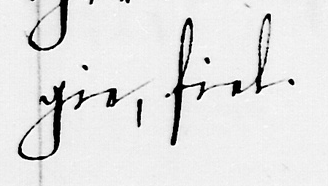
gie, fiel.
